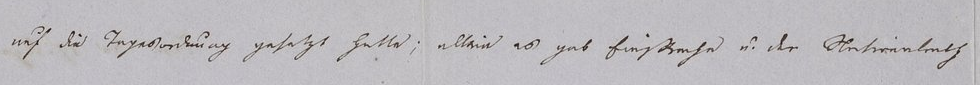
auf die Tagesordnung gesetzt hatte; allein es gab Einsprache u. der Nationalrath
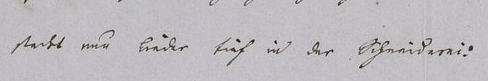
steckt nun wieder tief in der Schneiderei!
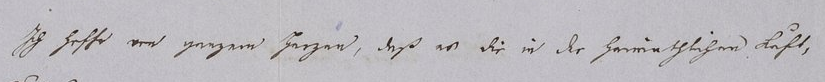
Ich hoffe von ganzem Herzen, daß es Dir in der heimathlichen Luft,
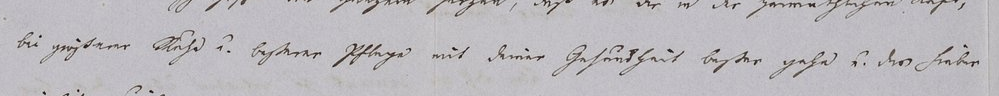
bei größerer Ruhe u. beßerer Pflege mit Deiner Gesundheit beßer gehe u. das Fieber
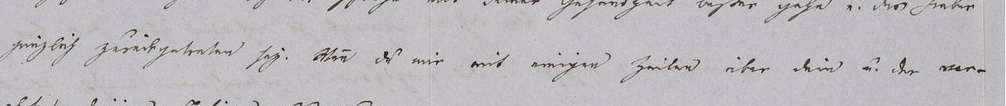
gänzlich zurückgetreten sey. Wenn Du mir mit einigen Zeilen über Dein u. der ver-
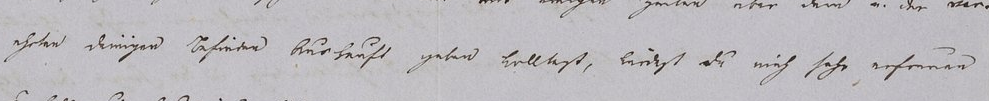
ehrten Deinigen Befinden Auskunft geben wolltest, würdest Du mich sehr erfreuen
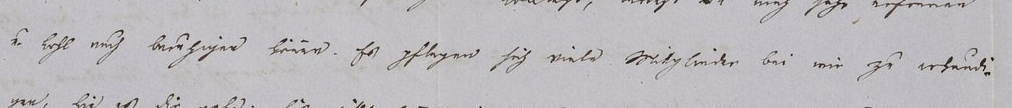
u. wohl auch beruhigen können. Es pflegen sich viele Mitglieder bei mir zu erkundi-
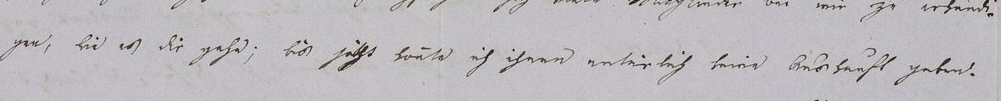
gen, wie es Dir gehe; bis jetzt konnte ich ihnen natürlich keine Auskunft geben.
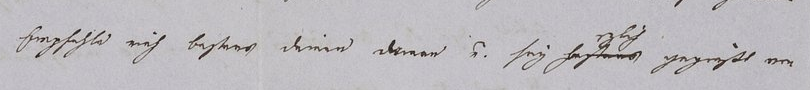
Empfehle mich bestens Deinen Damen u. sey bestensherzlich gegrüßt von
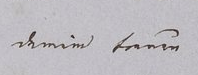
Deinem treuen
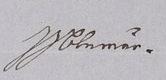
J J Blumer.
